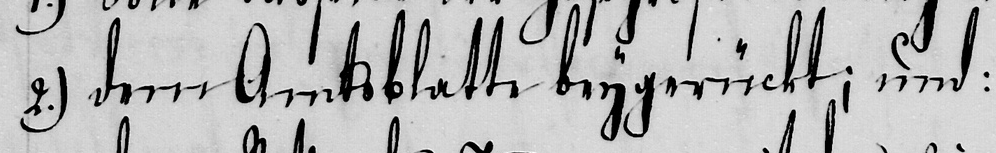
2.) dem Amtsblatte beygerückt; und:
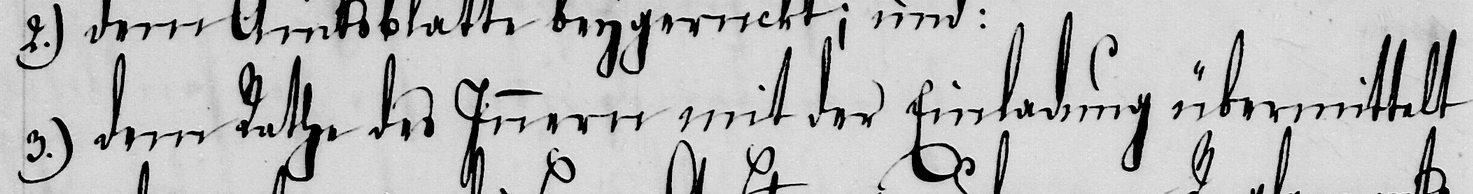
3.) dem Rathe des Innern mit der Einladung übermittelt
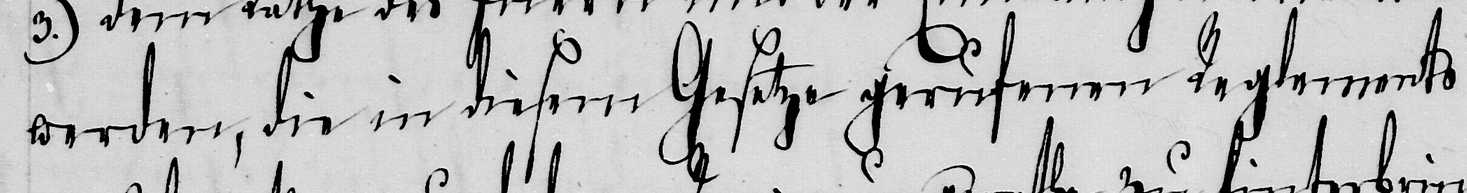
werden, die in diesem Gesetze gerufenen Reglements
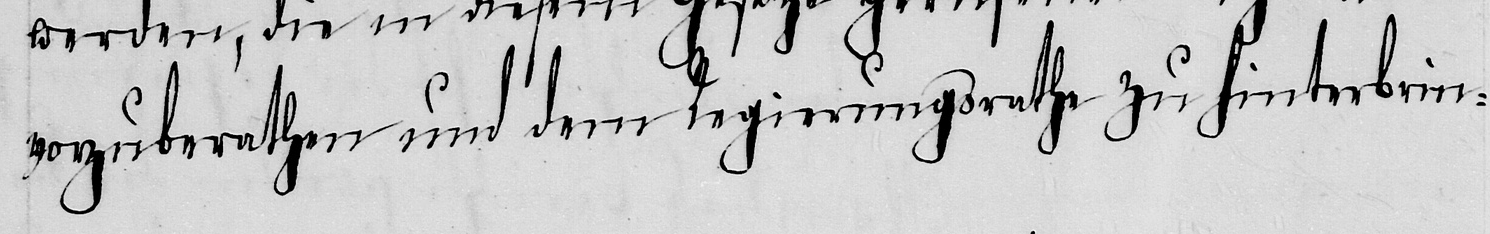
vorzuberathen und dem Regierungsrathe zu hinterbrin¬
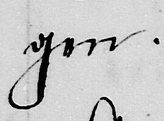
gen.
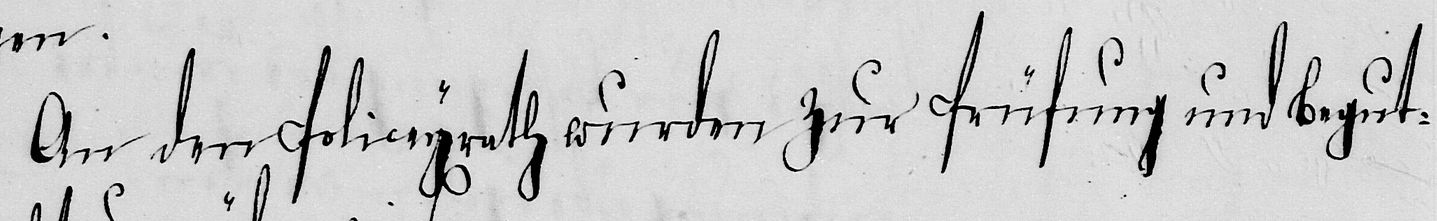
An den Policeyrath wurden zur Prüfung und Begut¬
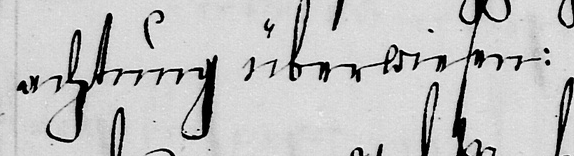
achtung überwiesen:
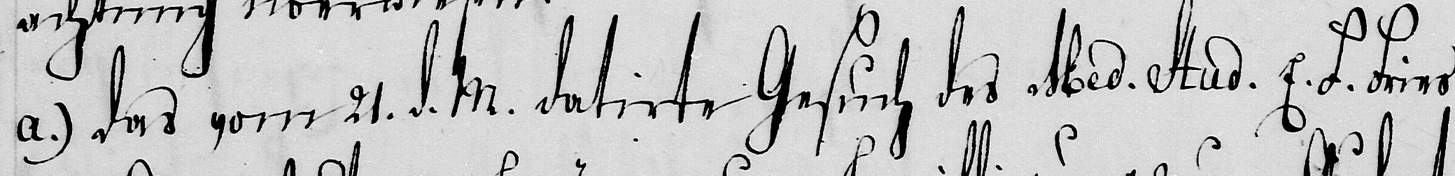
a.) das vom 21. d. M. datirte Gesuch des Med. Stud. E. F. Fries
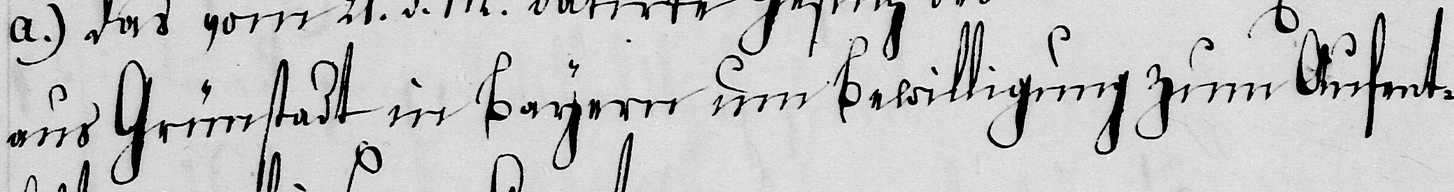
aus Grünstadt in Bayern um Bewilligung zum Aufent¬
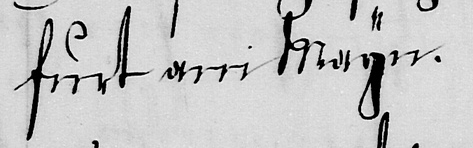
furt am Mayn.
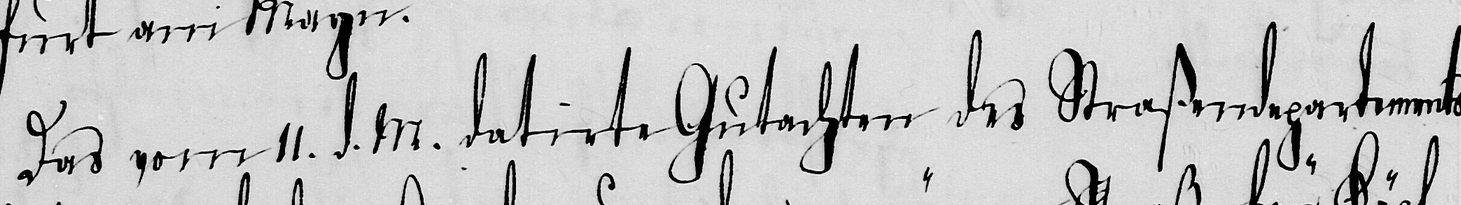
Das vom 11. d. M. datirte Gutachten des Straßendeparteme¬
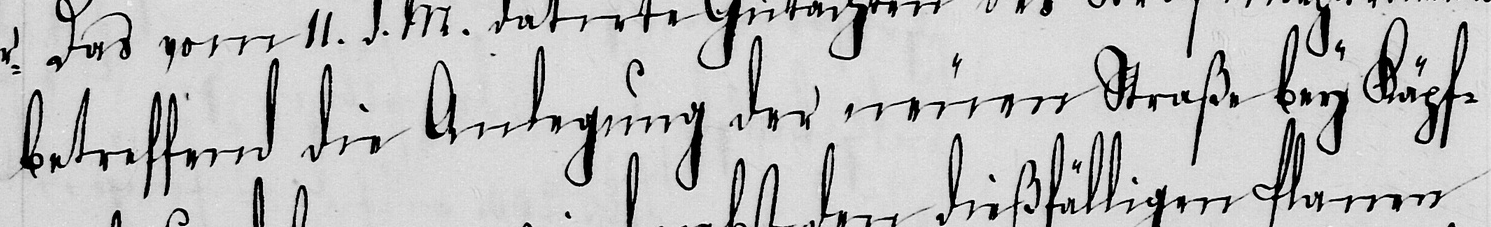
betreffend die Anlegung der neuen Straße bey Käpf¬
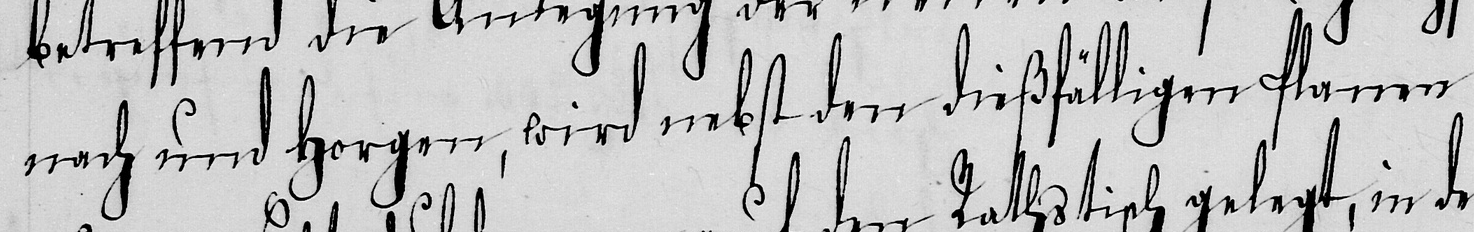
nach und Horgen, wird nebst den dießfälligen Planen
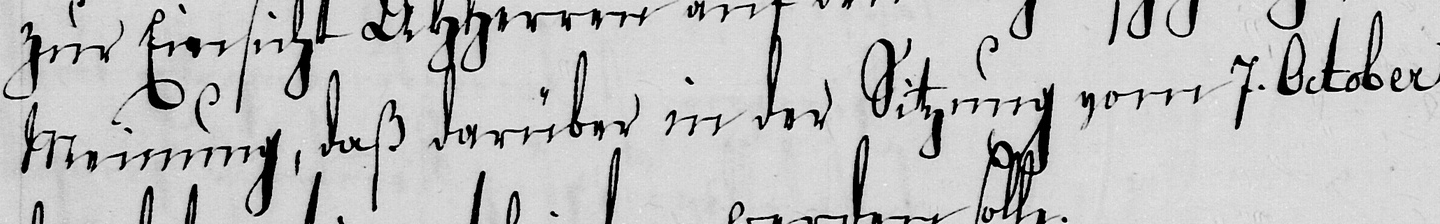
Meinung, daß darüber in der Sitzung vom 7. October
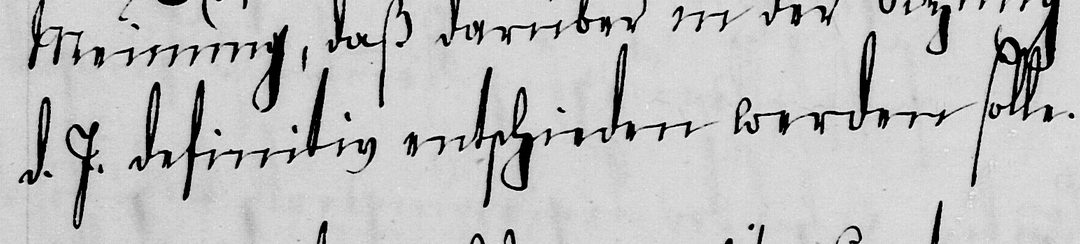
d. J. definitiv entschieden werden soll¬
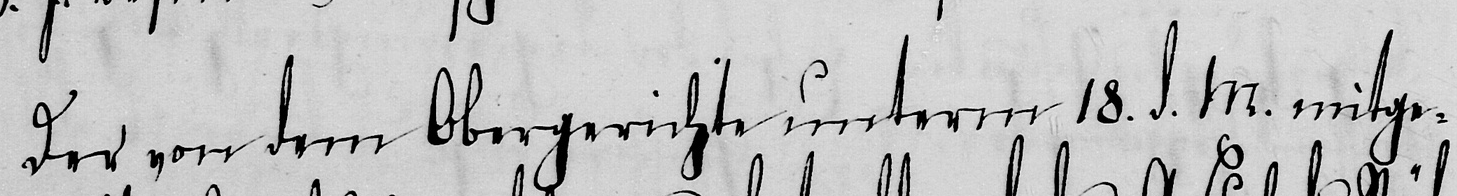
Der von dem Obergerichte unterm 18. d. M. mitge¬
